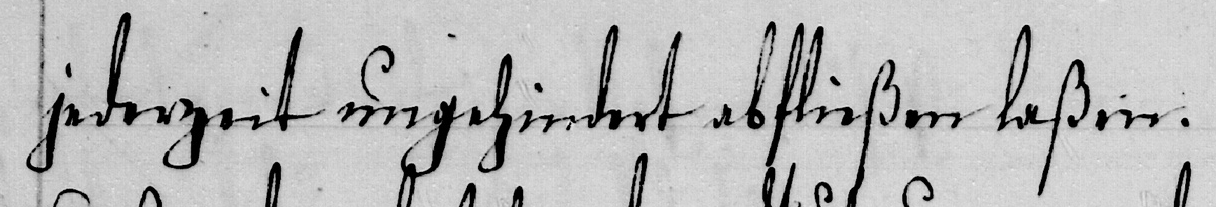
jederzeit ungehindert abließen laßen.
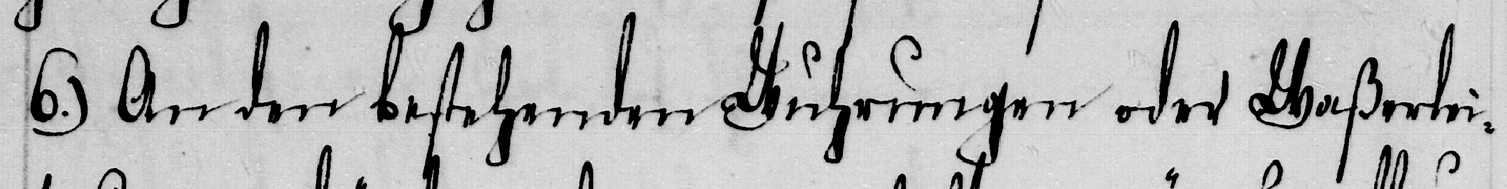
6.) An den bestehenden Wuhrungen oder Waßerle¬
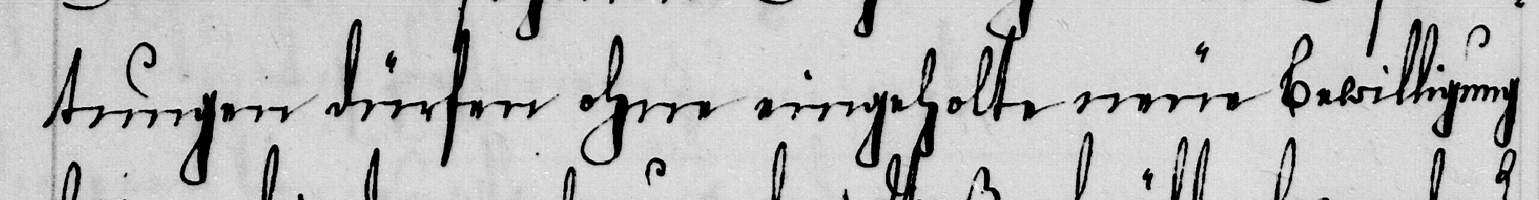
itungen dürfen ohne eingeholte neue Bewilligung
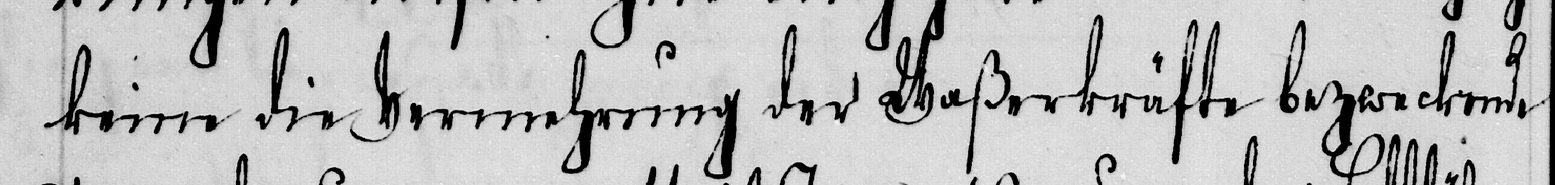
keine die Vermehrung der Waßerkräfte bezweckende
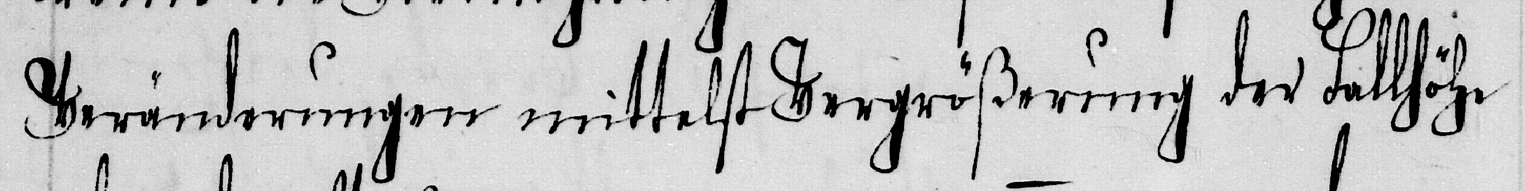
Veränderungen mittelst Vergrößerung der Fallhöhe
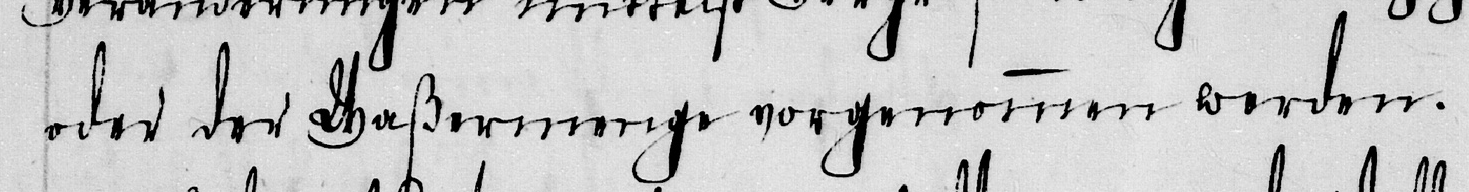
oder der Waßermenge vorgenommen werden.
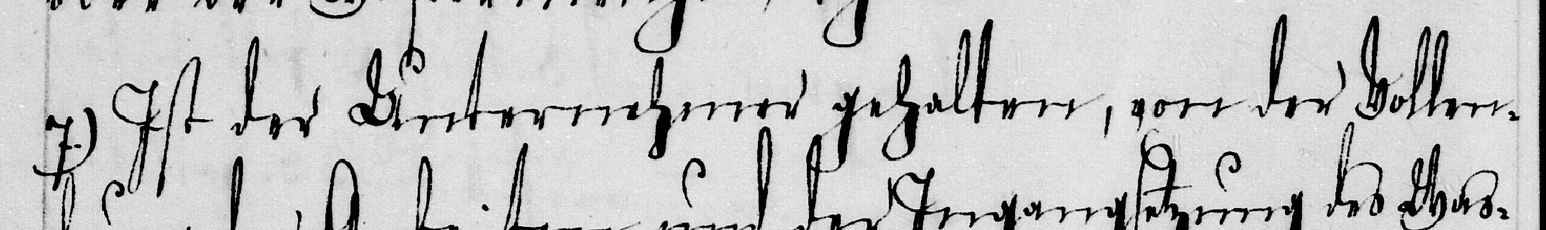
7.) Ist der Unternehmer gehalten, von der Vollen¬
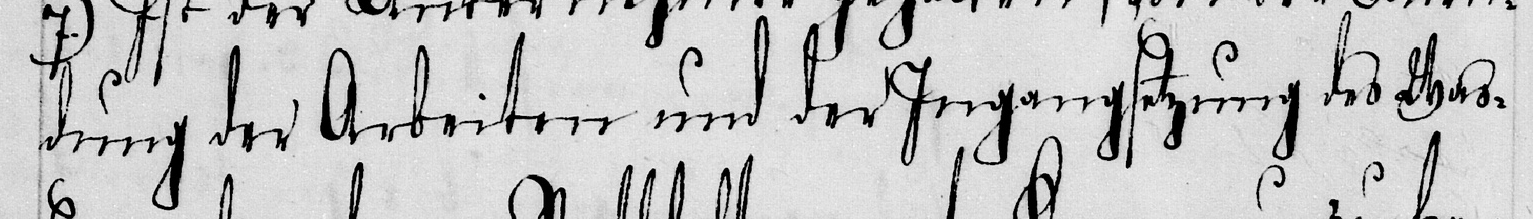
dung der Arbeiten und der Ingangsetzung des Waß¬
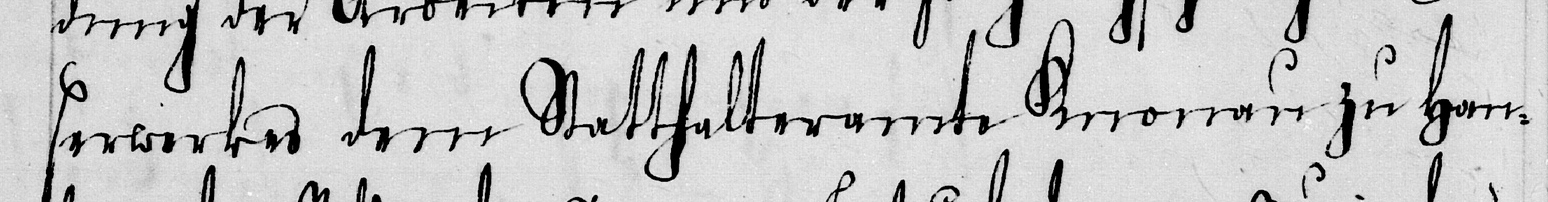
erwerkes dem Statthalteramte Knonau zu Han¬
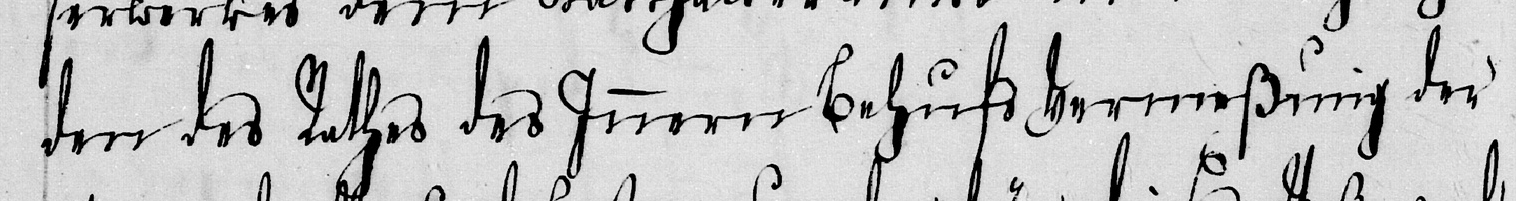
den des Rathes des Innern Behufs Vermeßung der
